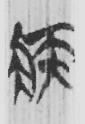疾
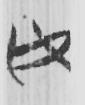女
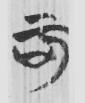可
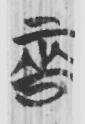{巫口}
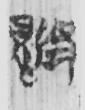{於鳥}（烏）
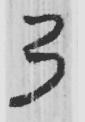乃
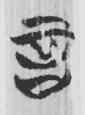言
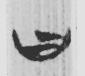曰
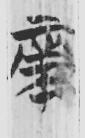帝
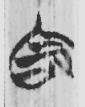命
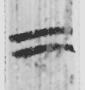二
